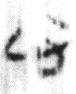心
